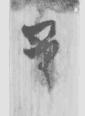邑
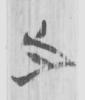之
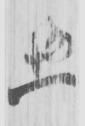{爪土}
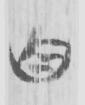自
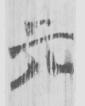亓
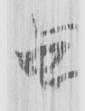𠁩
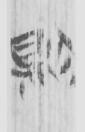則
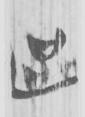區
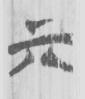亓
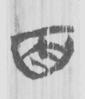百
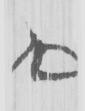褥
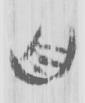自
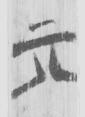亓
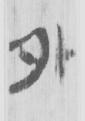外
